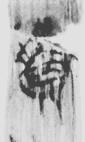{貝叕}
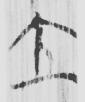立
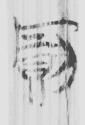{貝叚}
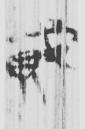貣
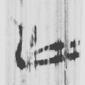亡
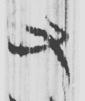又
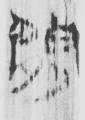{門夕刀}
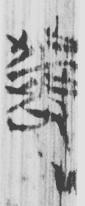{歮又}
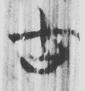古
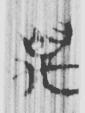萬
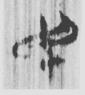民
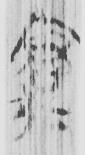{宀君火}
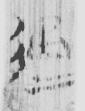通
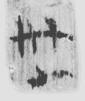{卅七}
